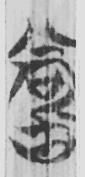嘗
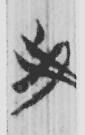我
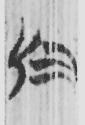於
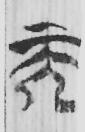而
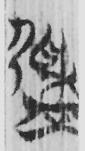{弓采皿}
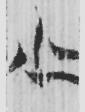少
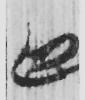臣
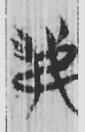弗
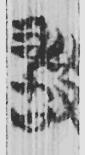敢
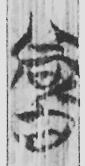嘗
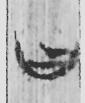曰
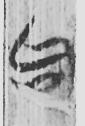句
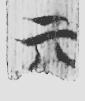亓
